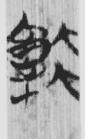{享䖵}
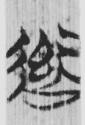{行糸止}
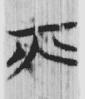火
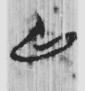㠯（以）
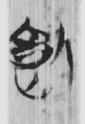飤
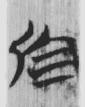於
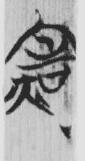{宀火告}
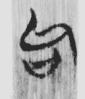句
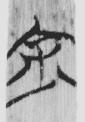余
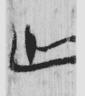亡
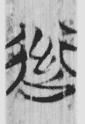{行糸止}
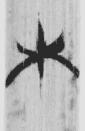木
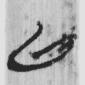㠯（以）
